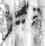於
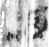西
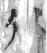北
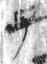子
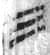三
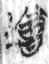增
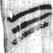三
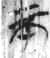不
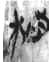相
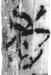志
